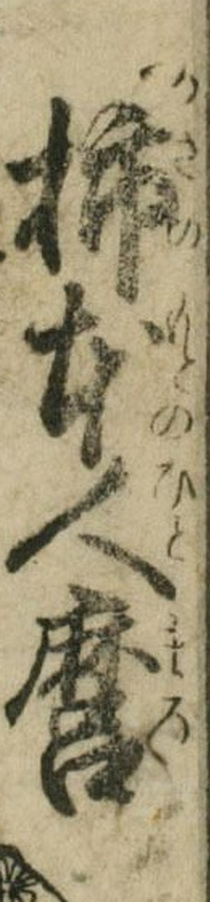柿本人麿
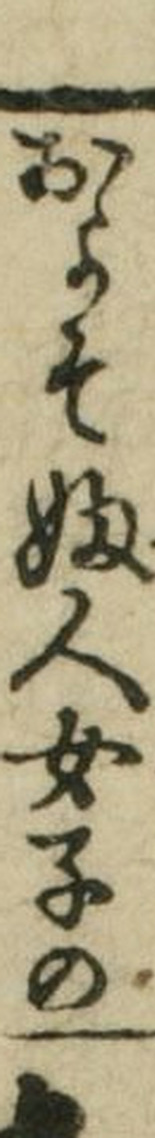およそ婦人女子の
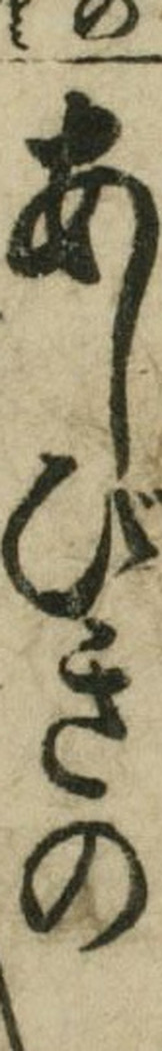あしびきの
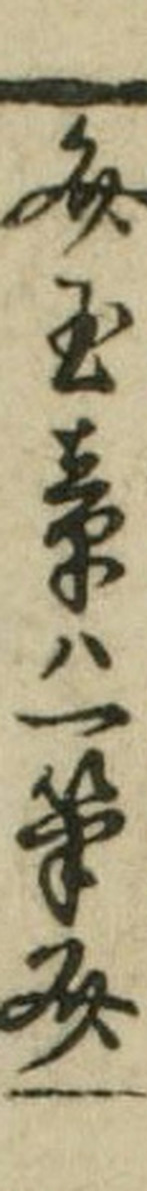文玉章は一筆文
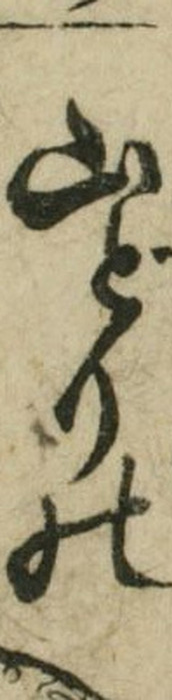山どりの
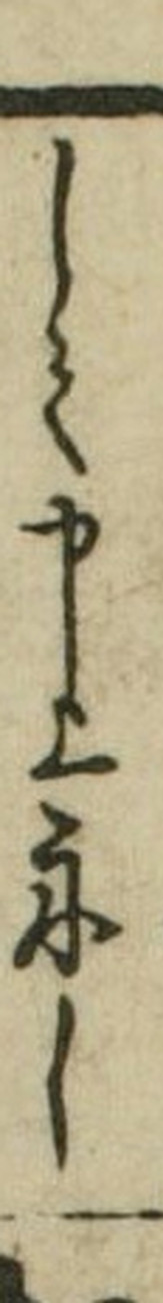して申上示し
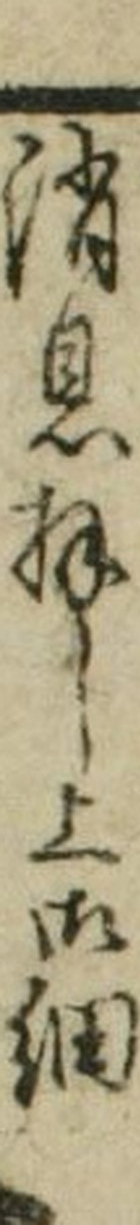消息拝し上御細
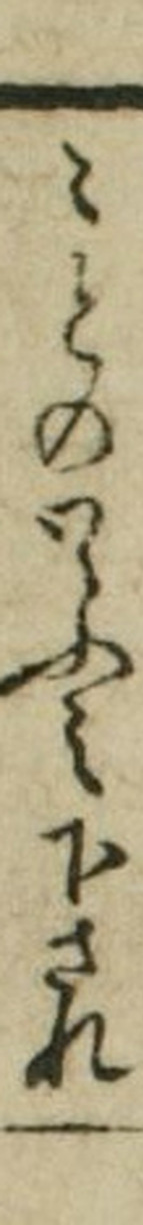々との御ふみ下され
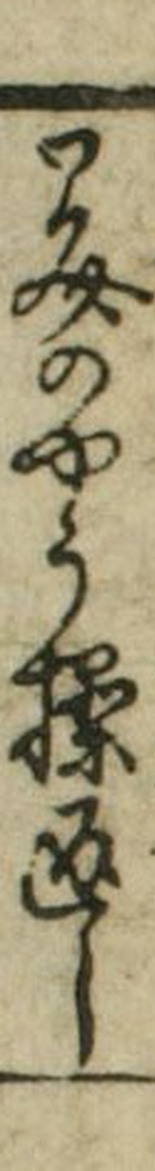御文のやう繰返し
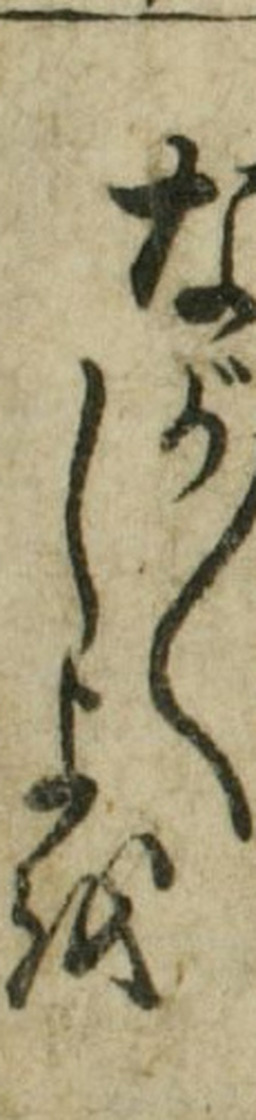しよを
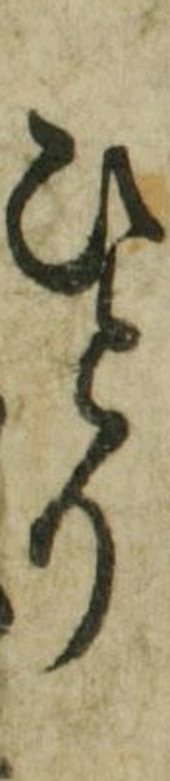ひとり
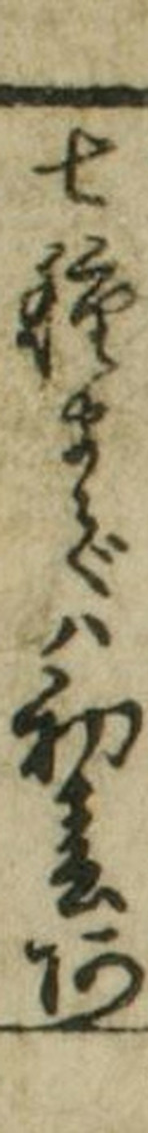七種までは初春あ
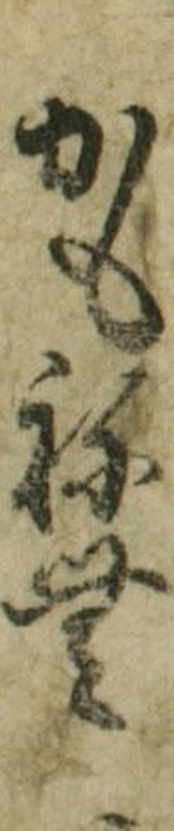かもねむ

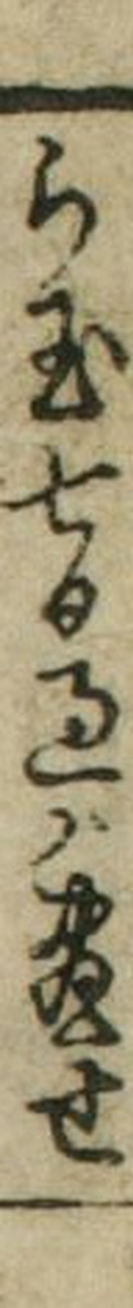ら玉七日過は尽せ
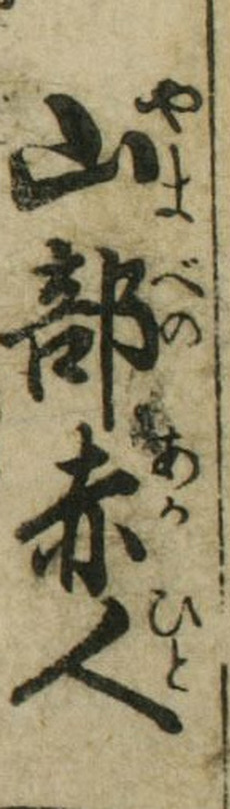山部赤人
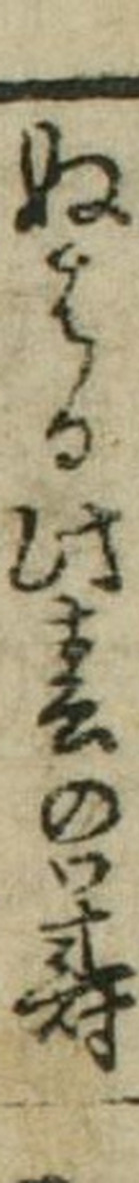ぬはる此春の御寿
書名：百人一首
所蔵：東京学芸大学教育コンテンツアーカイブ
